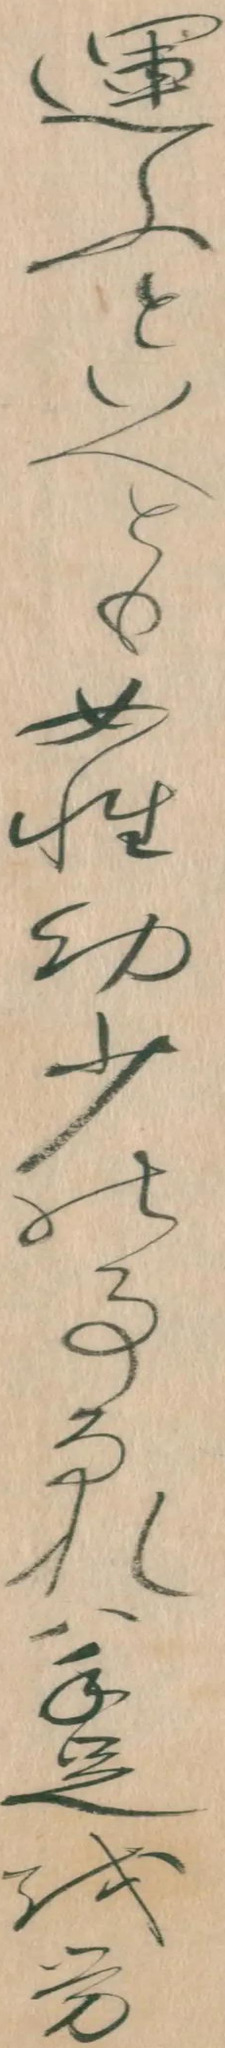運ふといへとも女性幼少の事なれは手足を労
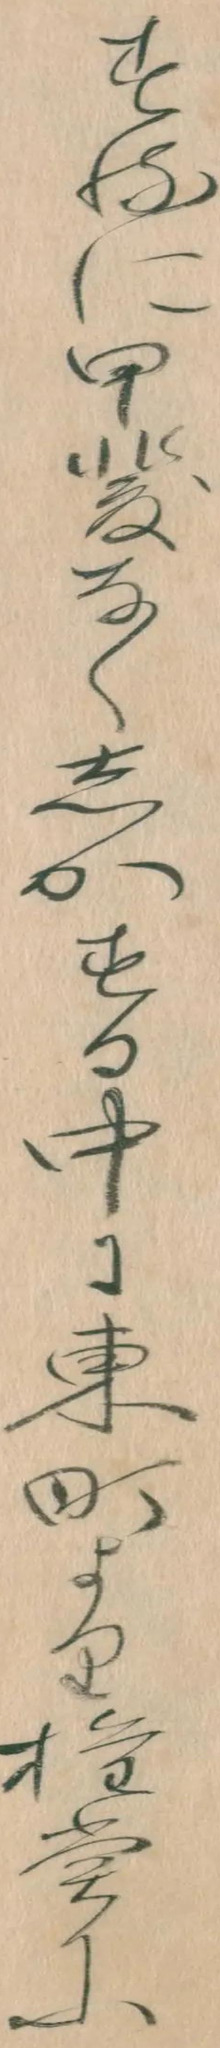するに甲斐なくしかする中に東町より権堂に
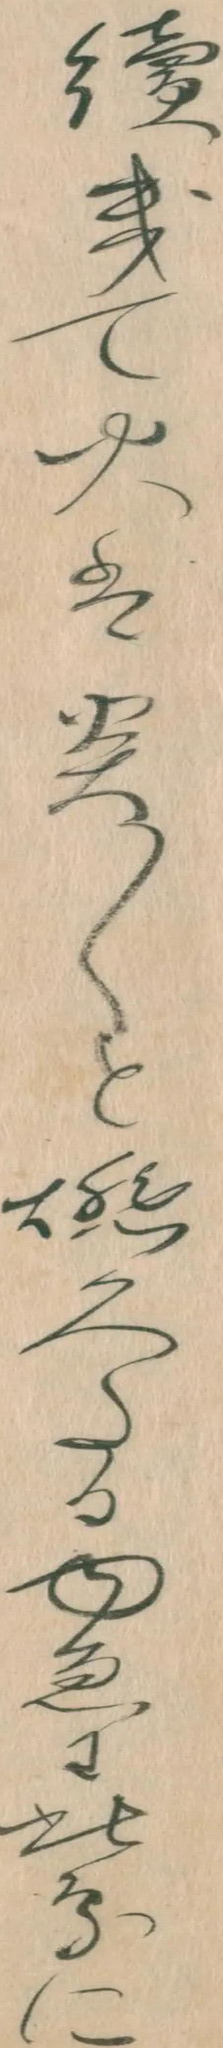続きて火は炎〳〵と燃くたるゆゑに此處に
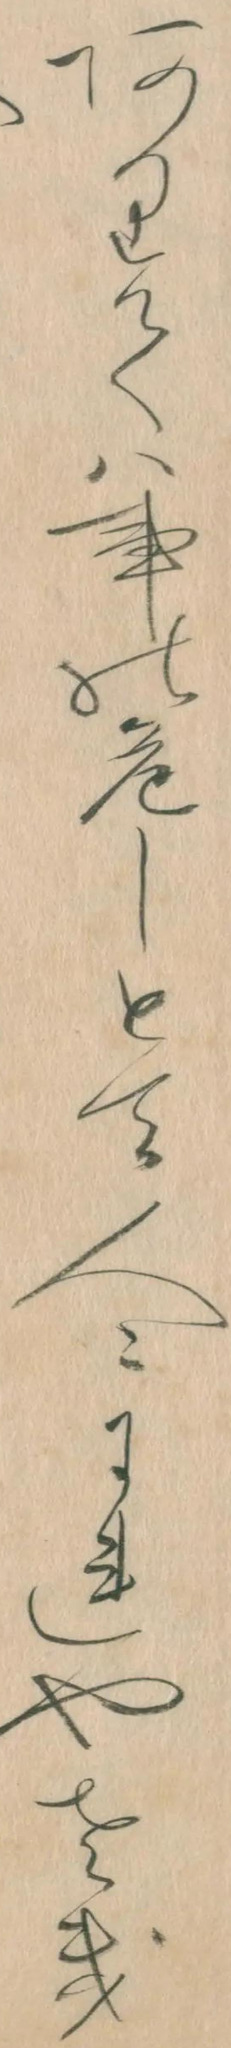ありけくは事の危しとて人々に連やさき
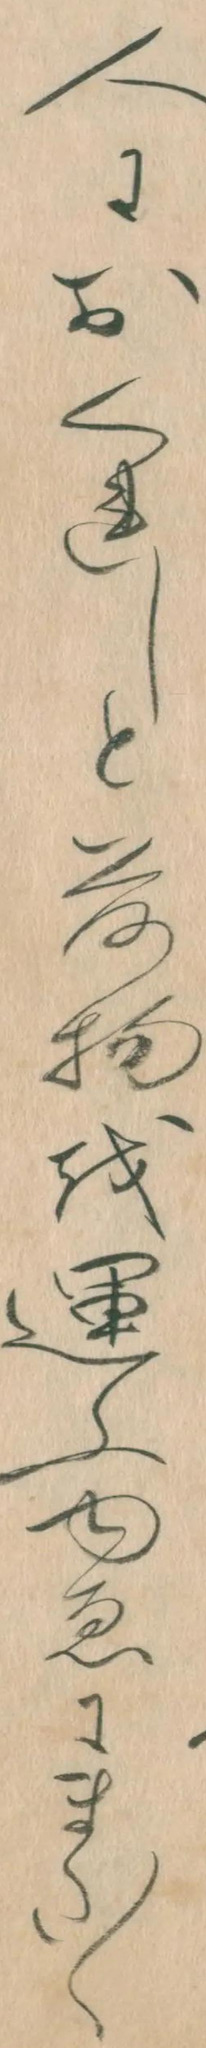人におくれしと荷物を運ふゆゑにまた〳〵
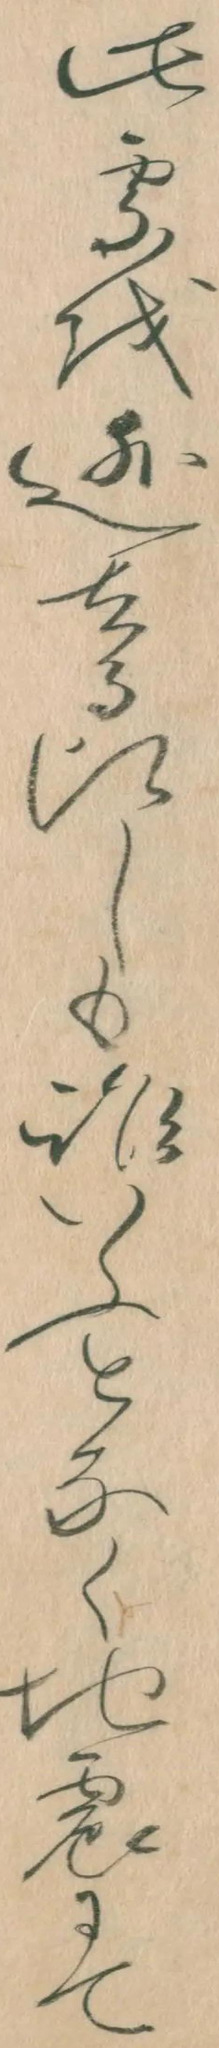此處を逃たる頃しも誰いふとなく地震にて
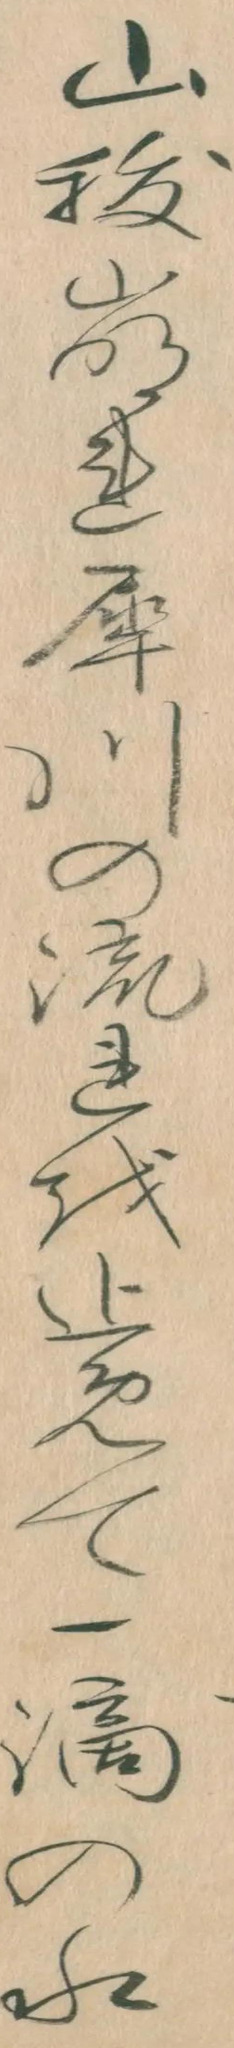山抜崩れ犀川の流れを止めて一滴の水
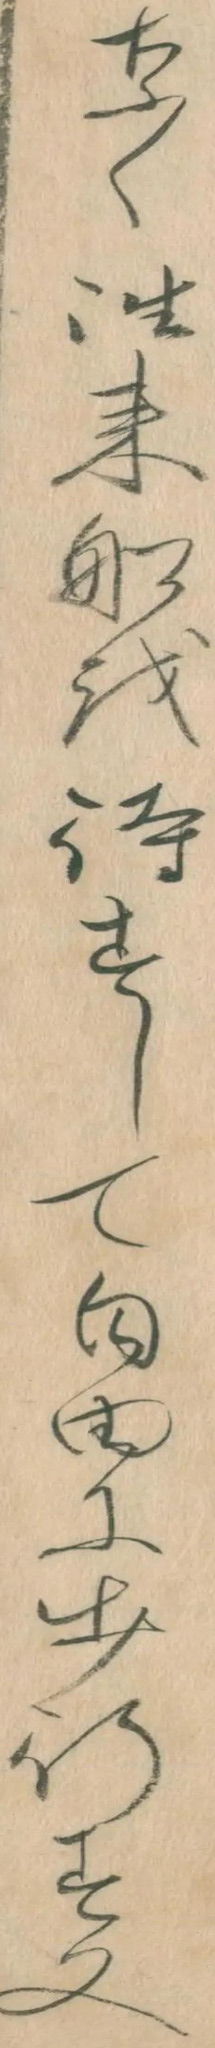なく往来船を待すして自由に歩行す又

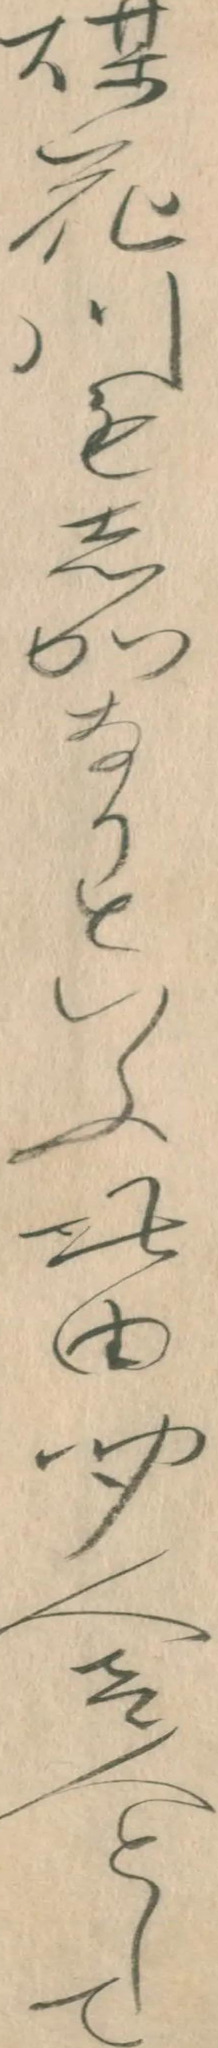煤花川もしかりなりといふ此由聞人壱人として
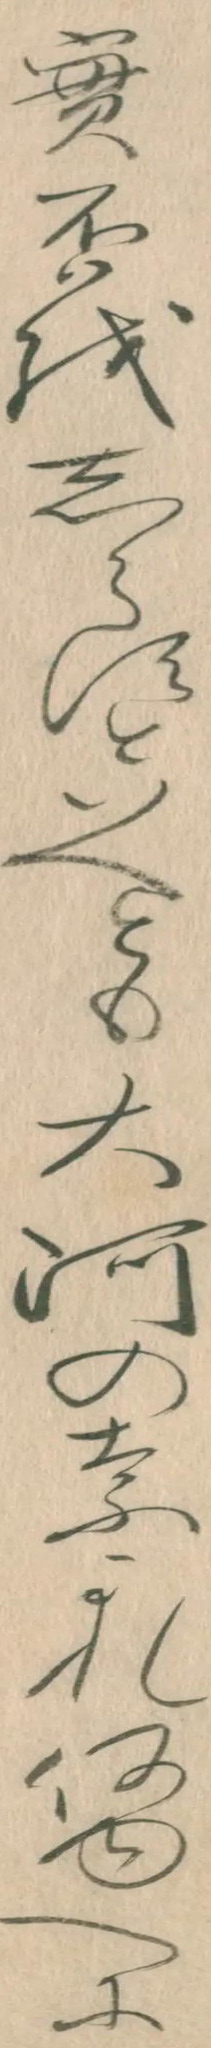実否をしらすといへとも大河のなかれ何ゆへに
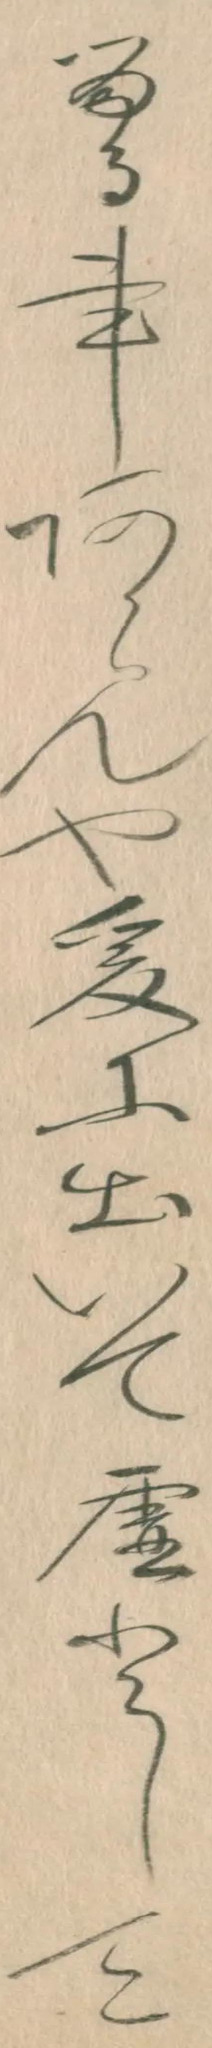留る事あらんや爰に出いて虚として
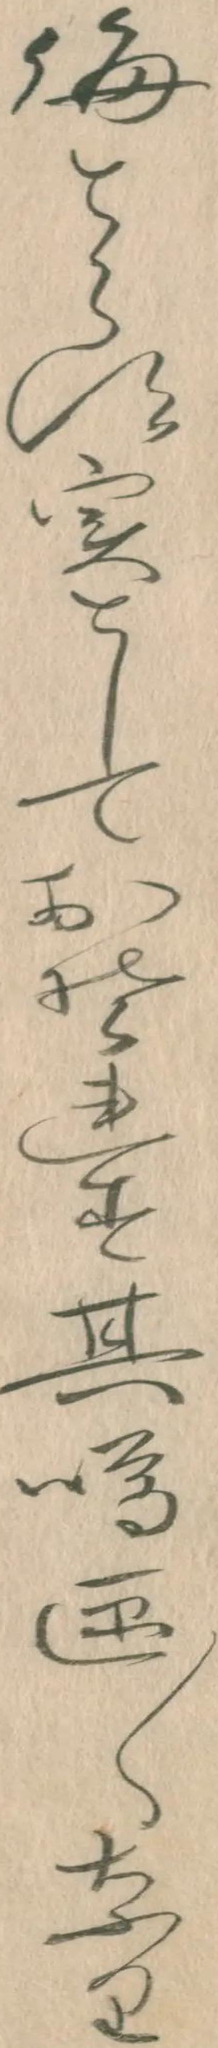侮とらす実としておそれす其噂区〳〵なり
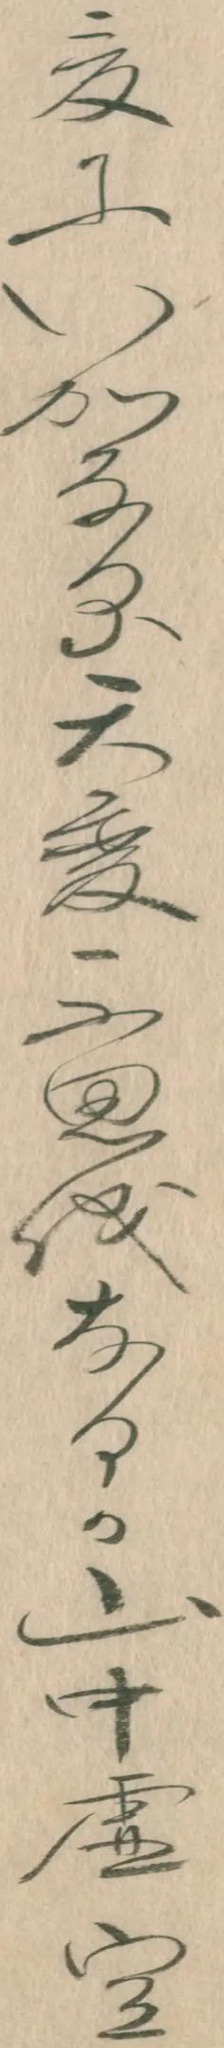爰にいかなる天変不思議なるか山中虚空
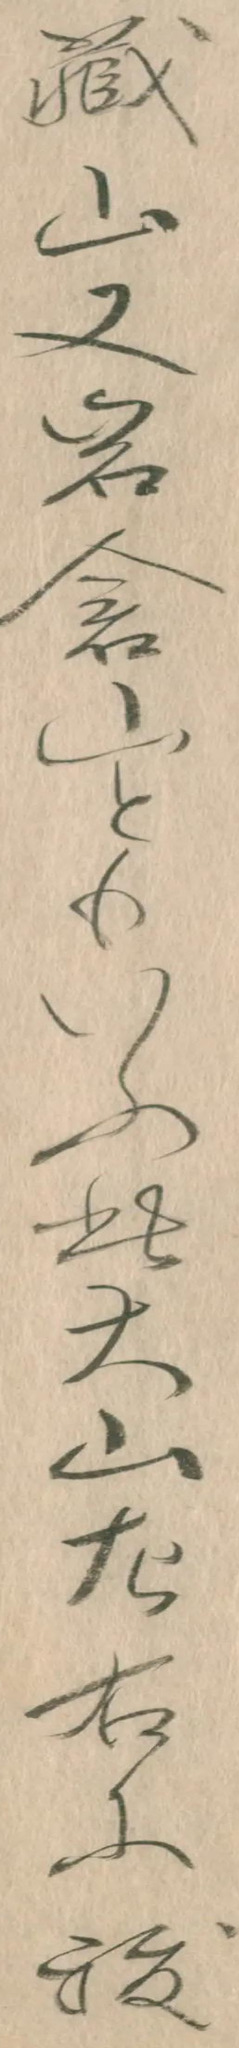藏山又岩倉山ともいふ此大山左右に抜
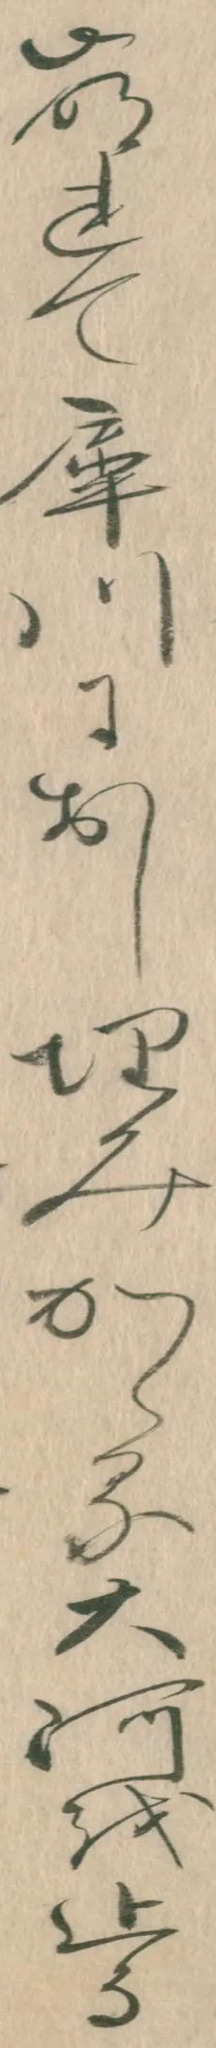崩れて犀川におし埋みかゝる大河を止る
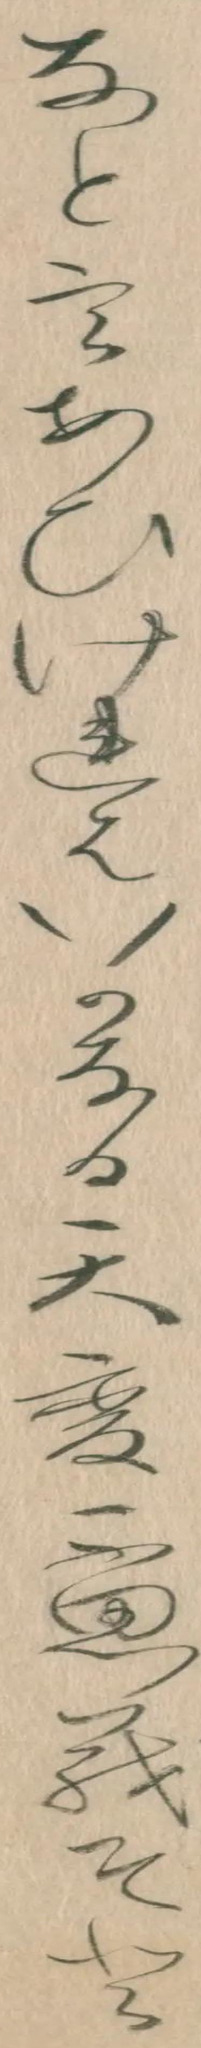なと言あひけれはいかなる天変不思義そと
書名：俗語之種. [5]
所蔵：国立国会図書館 National Diet Library, JAPAN
